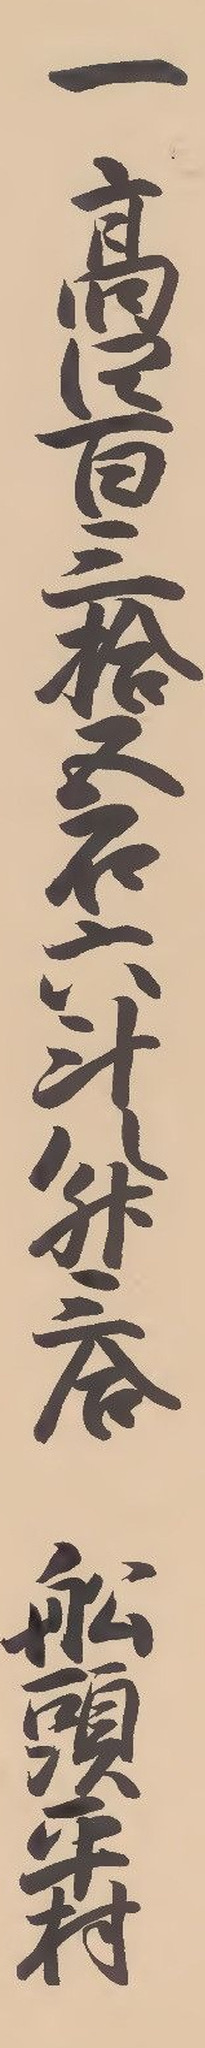一高四百三拾五石六斗八升三合船頭平村
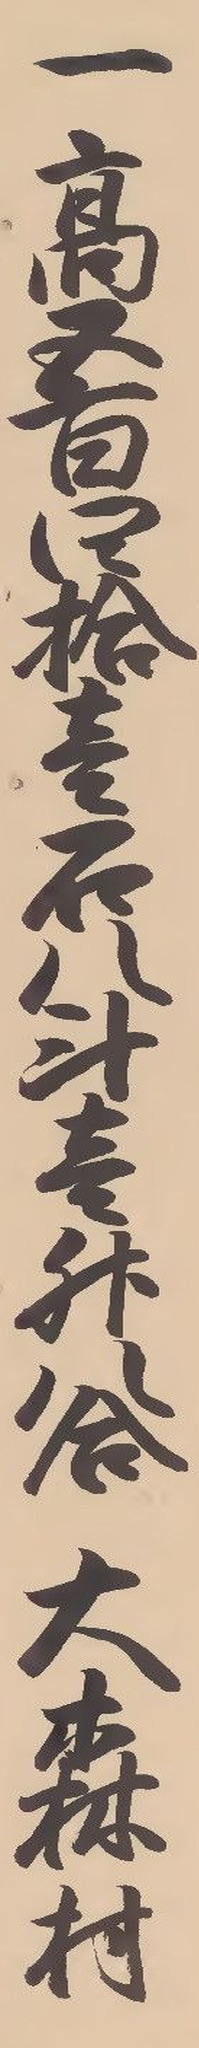一高五百四拾壱石八斗壱升八合大森村
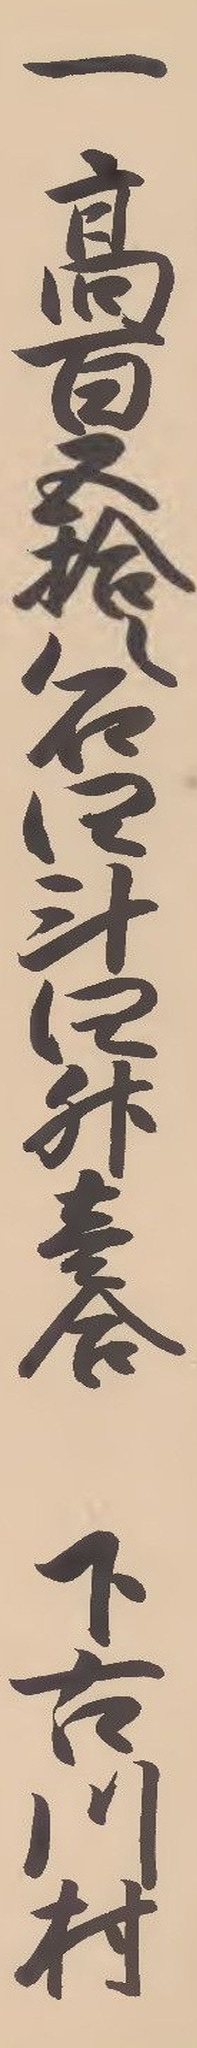一高百五拾八石四斗四升壱合下古川村
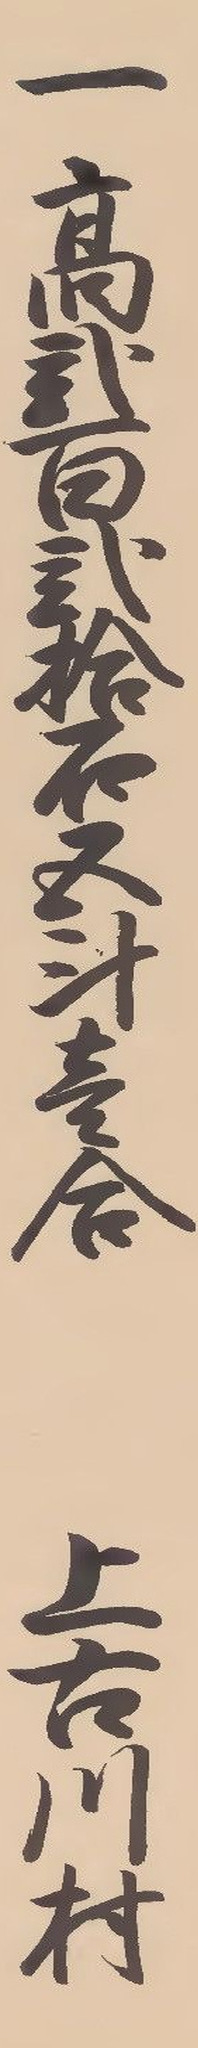一高弐百弐拾石五斗壱合上古川村
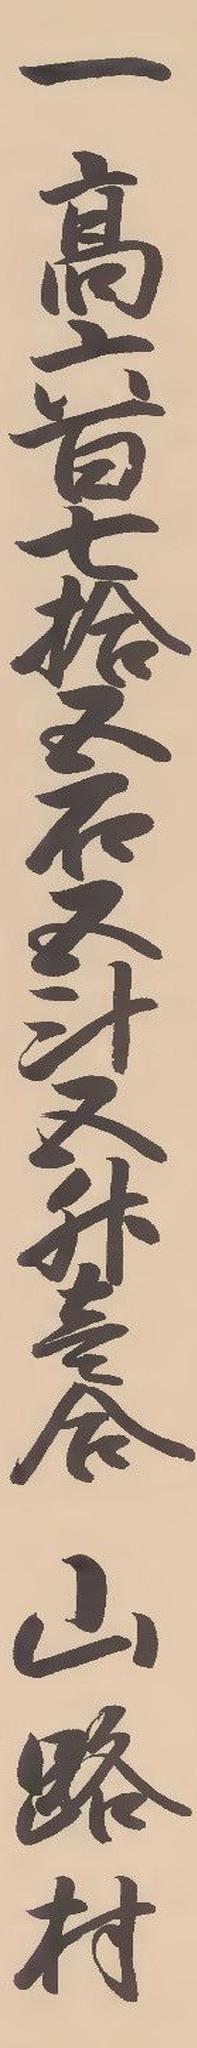一高六百七拾五石五斗五升壱合山路村
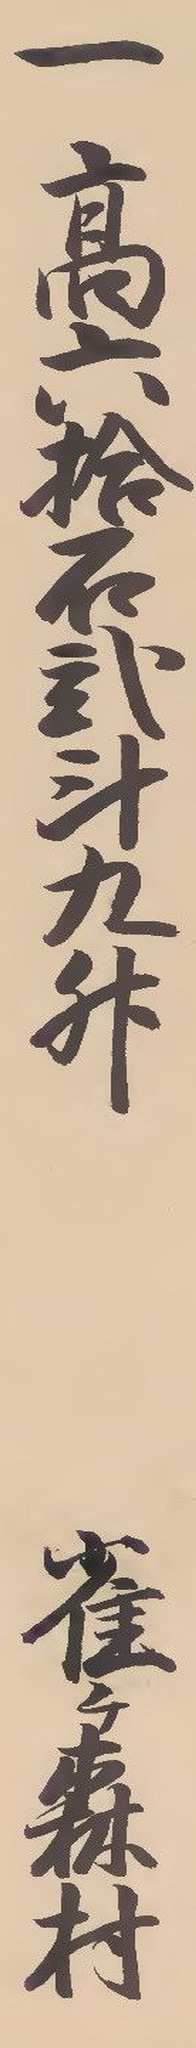一高六拾石弐斗九升雀ヶ森村

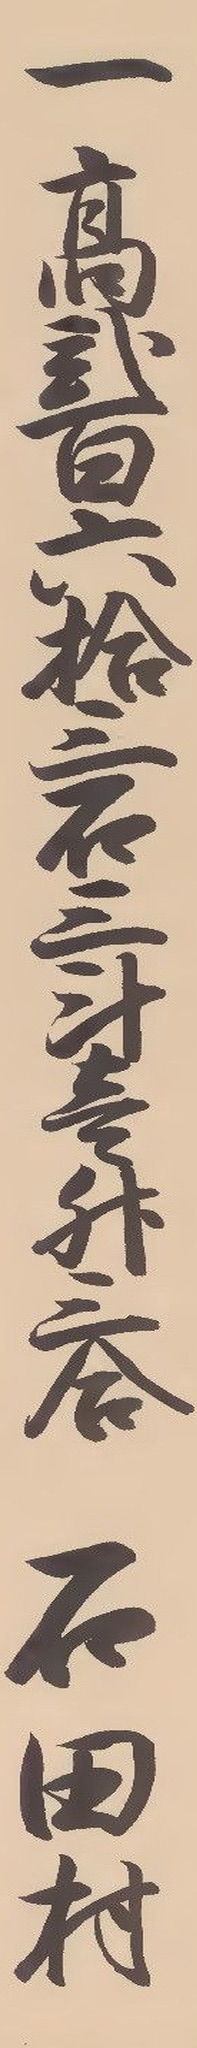一高弐百六拾三石三斗壱升三合石田村
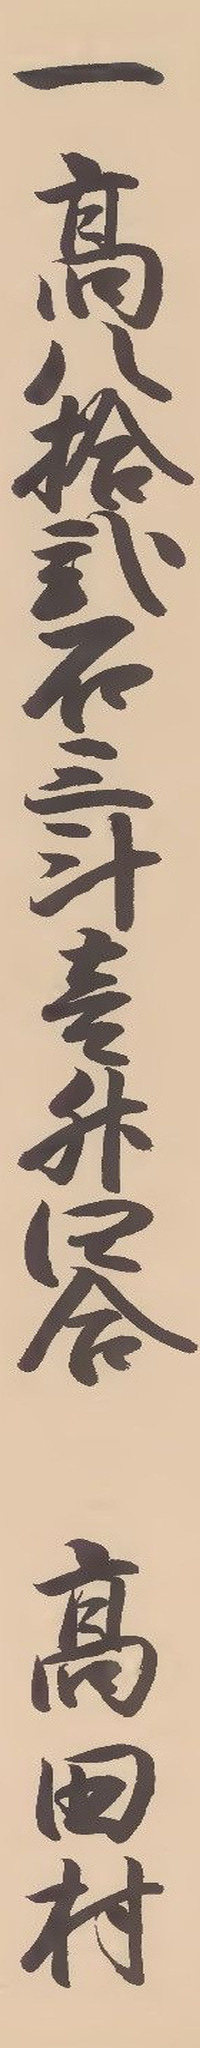一高八拾弐石三斗壱升四合高田村
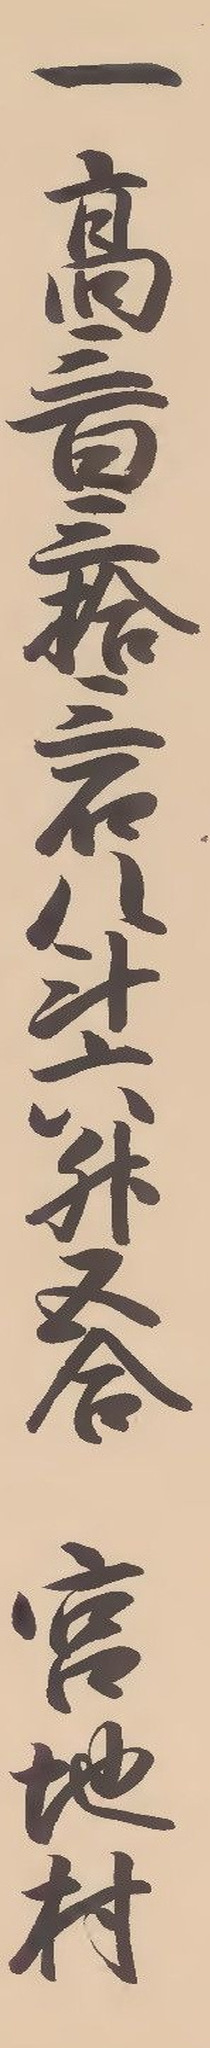一高三百三拾三石八斗六升五合宮地村
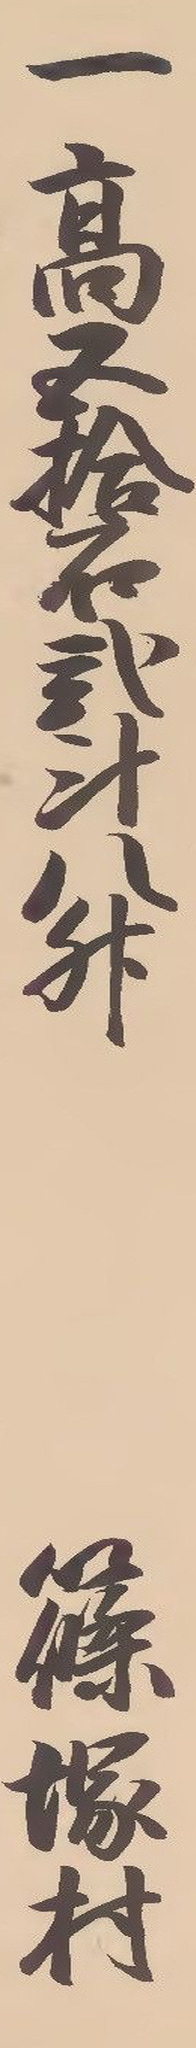一高五拾石弐斗八升篠塚村
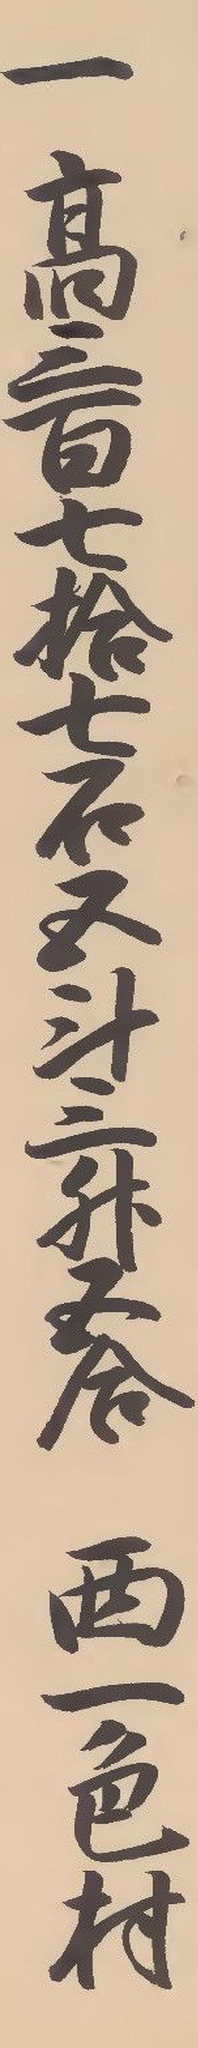一高三百七拾七石五斗三升五合西一色村
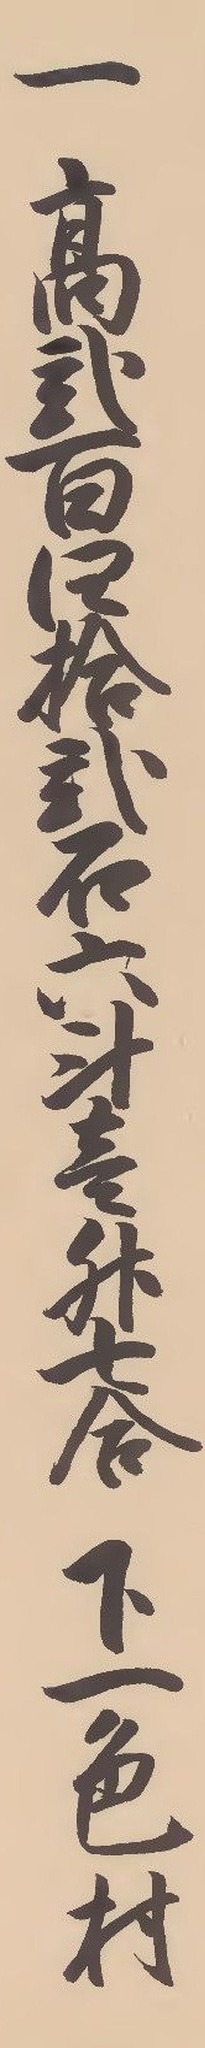一高弐百四拾弐石六斗壱升七合下一色村
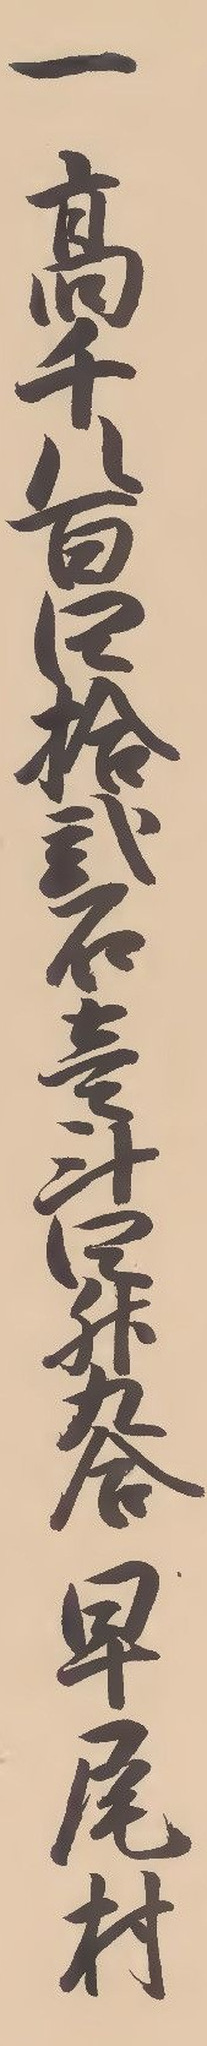一高千八百四拾弐石壱斗四升九合早尾村

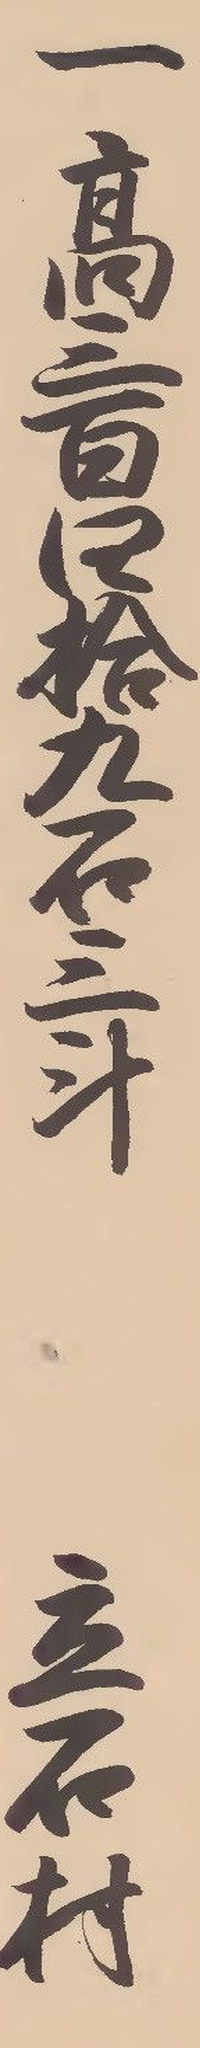一高三百四拾九石三斗立石村
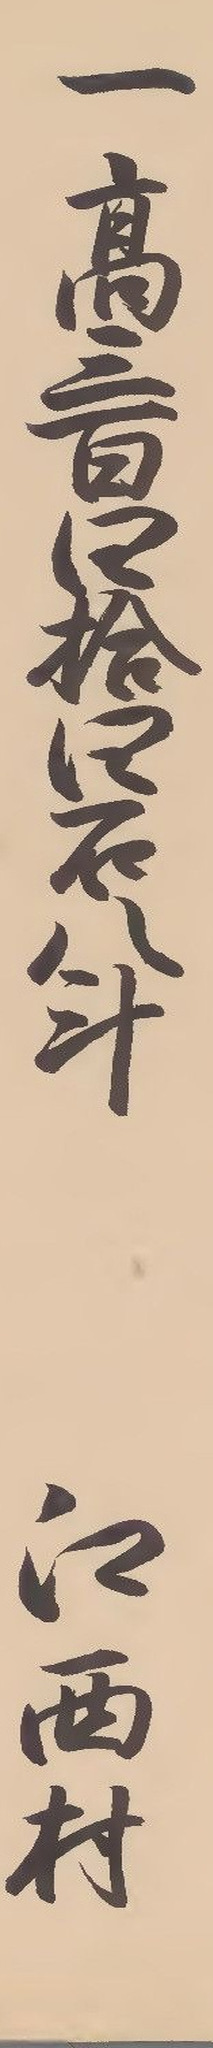一高三百四拾四石八斗江西村
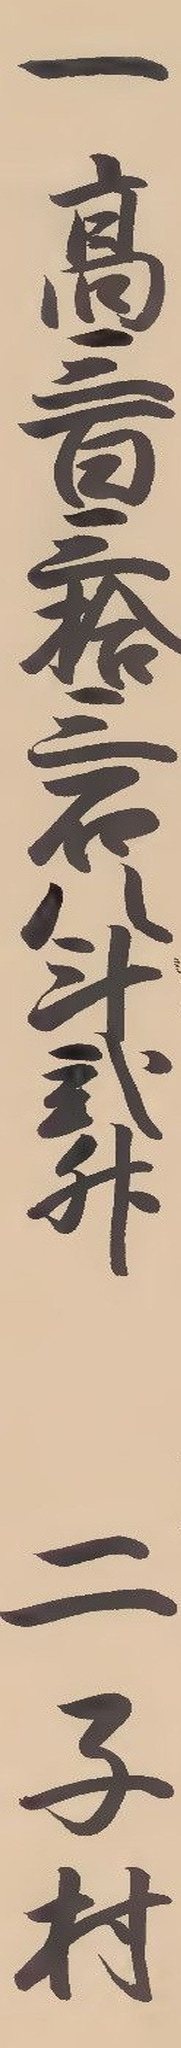一高三百四拾四石八斗江西村
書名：尾張国郷帳
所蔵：国立公文書館 National Archives of Japan
